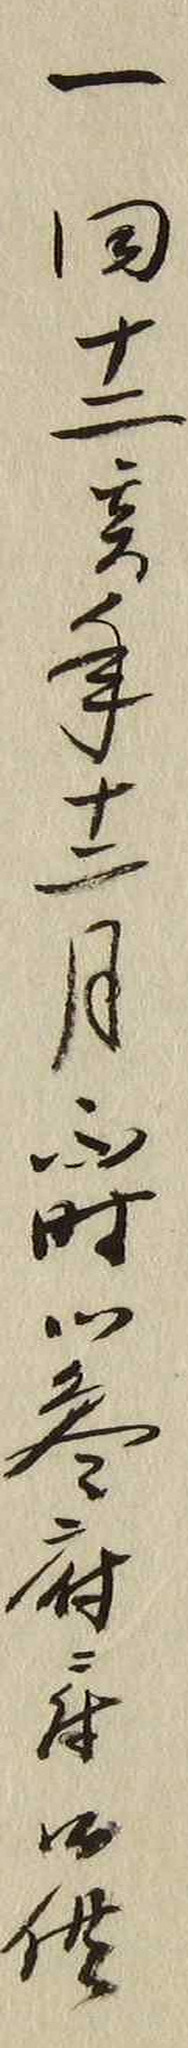一同十二亥年十二月不時御参府ニ付御供
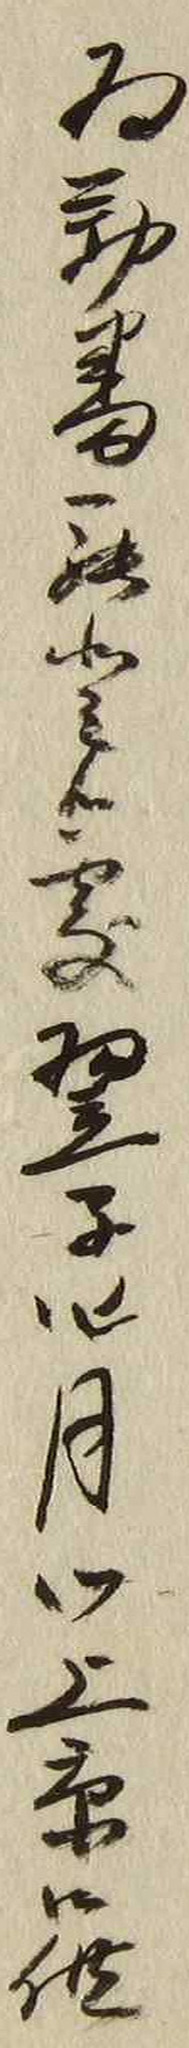為勤番罷登候処翌子四月御上京御供
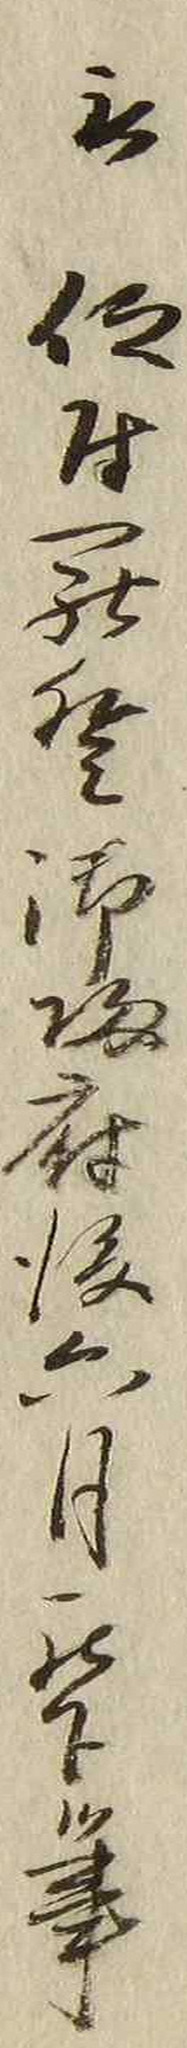被仰付罷登御帰府後六月罷下候事
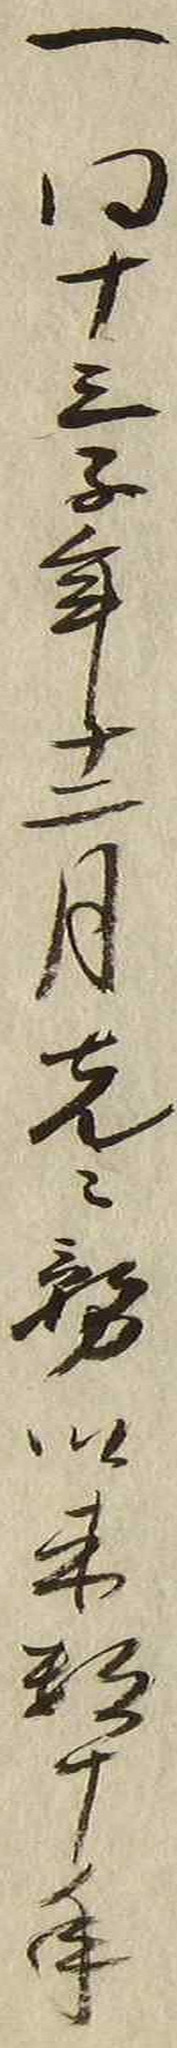一同十三子年十二月先々務以来数十年

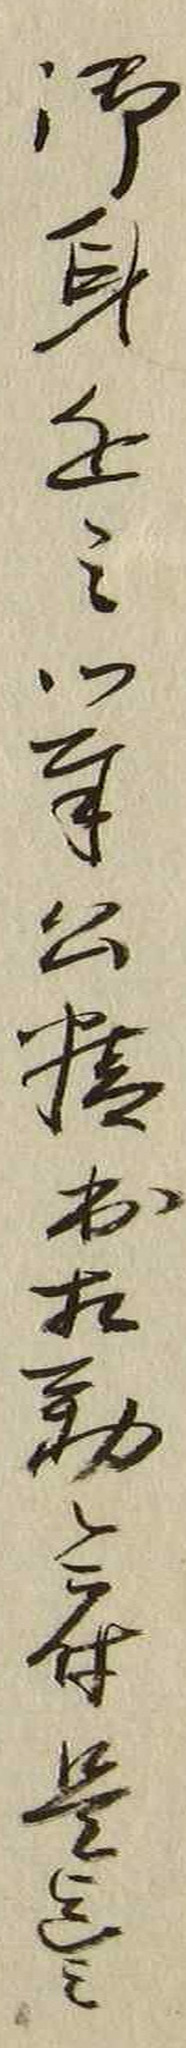御身近之御奉公精出相勤候ニ付是迄之
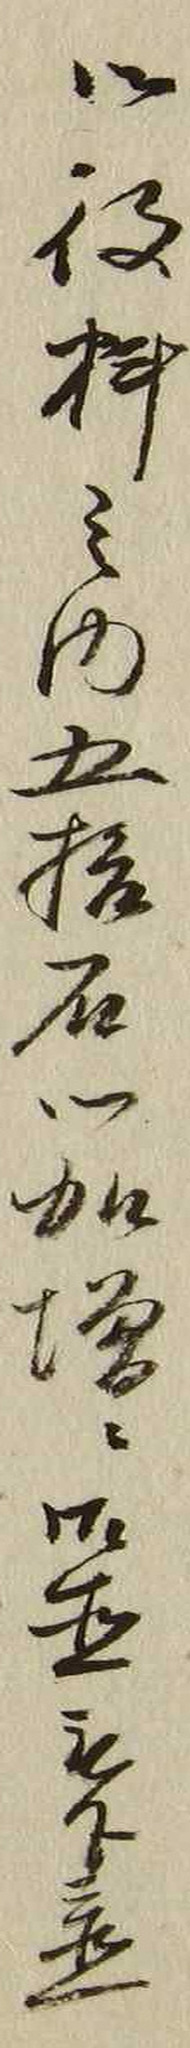御役料之内五拾石御加増ニ御直被下置
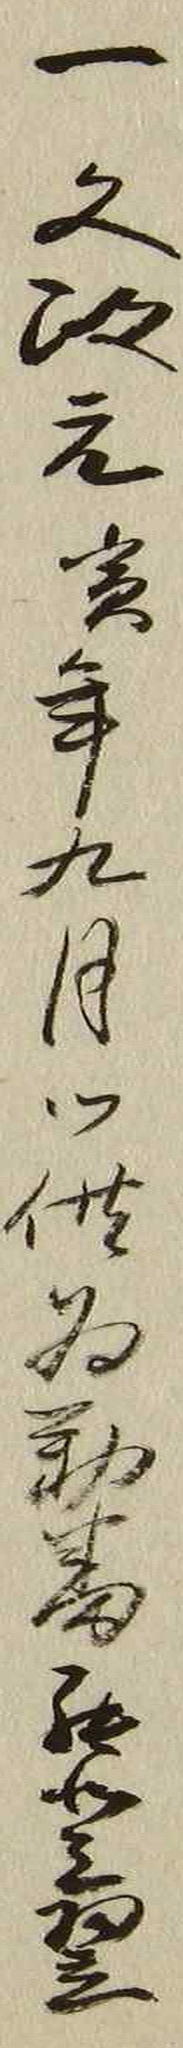一文政元寅年九月御供為勤番罷登翌
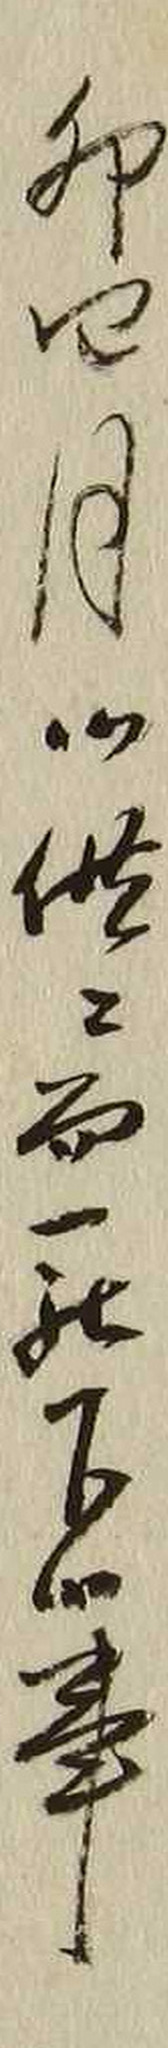卯四月御供ニ而罷下候事
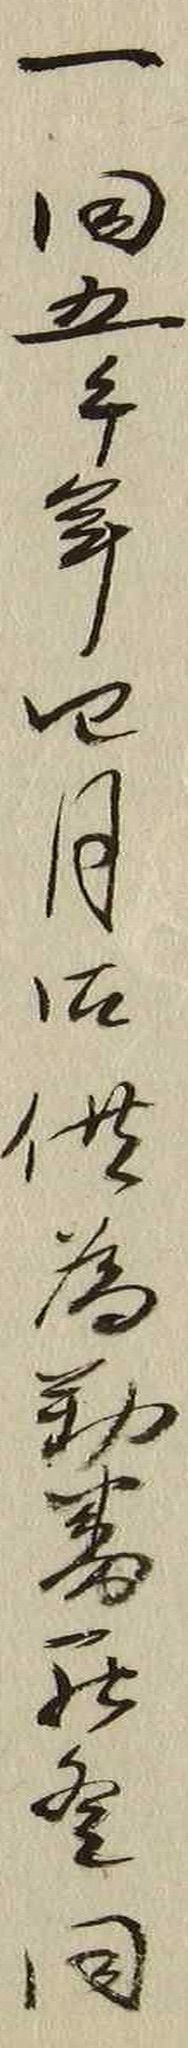一同五午年四月御供為勤番罷登同
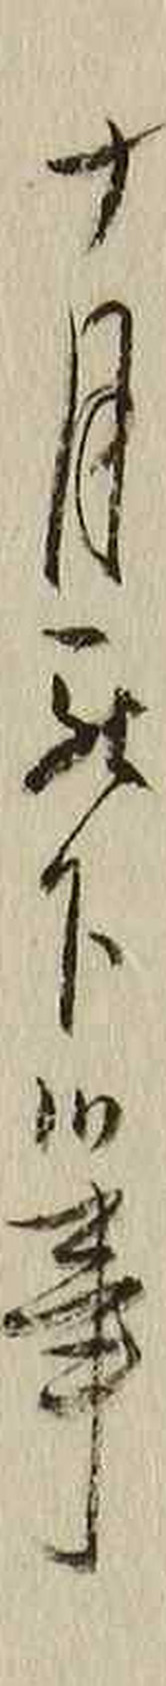十月罷下候事
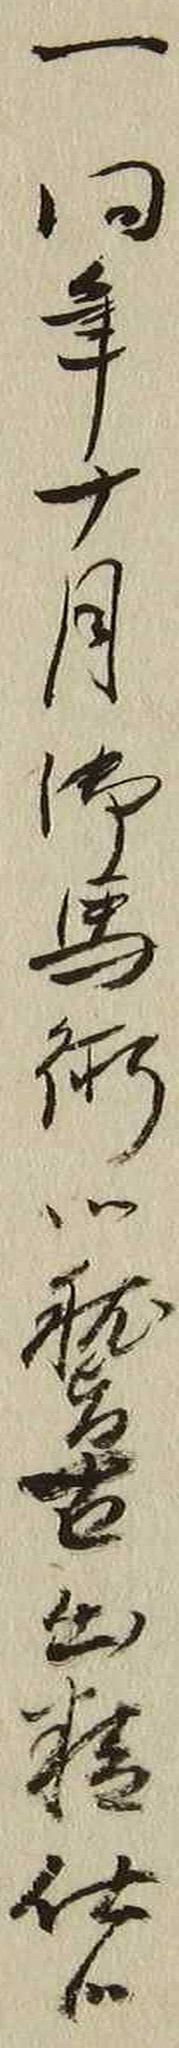一同年十月御馬術御稽古出精仕候
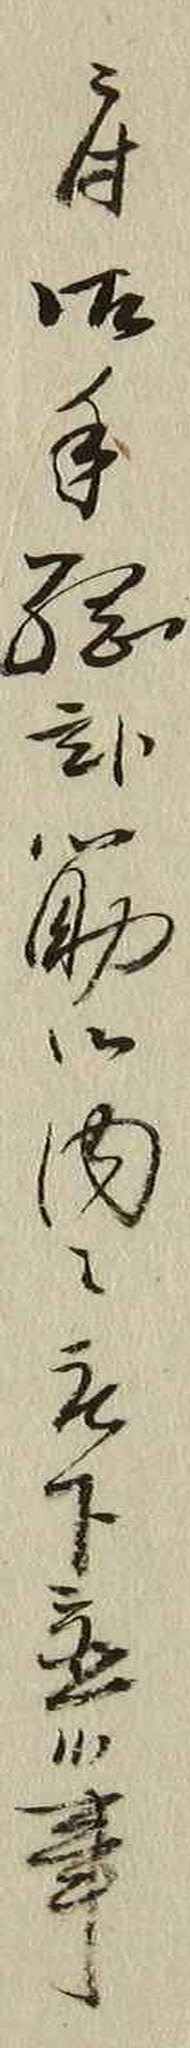ニ付御手綱弐筋御内々被下置候事
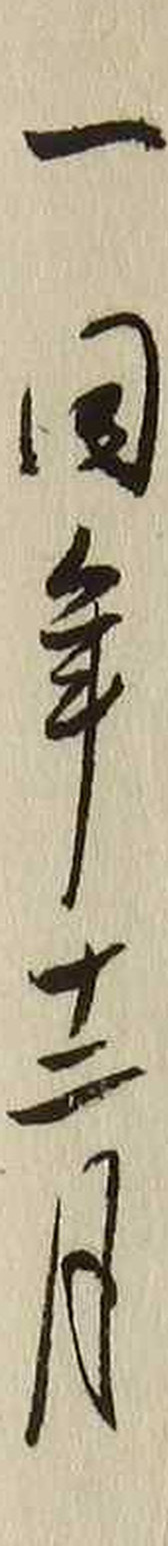一同年十二月
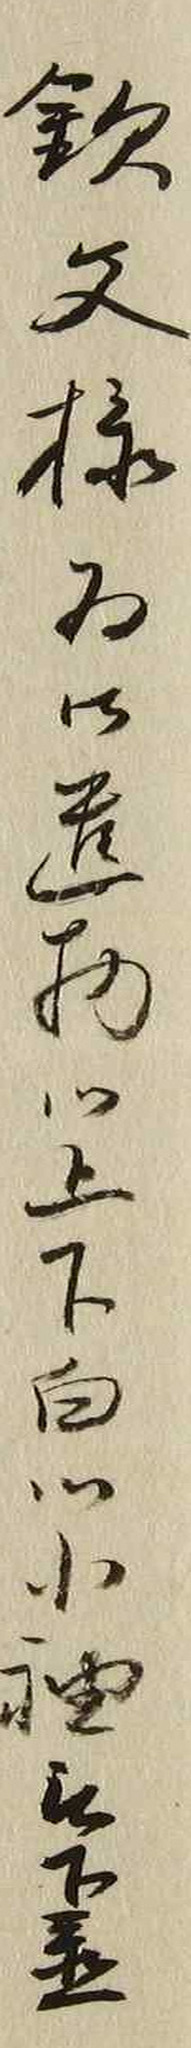欽文様為御遺物御上下白御小袖被下置
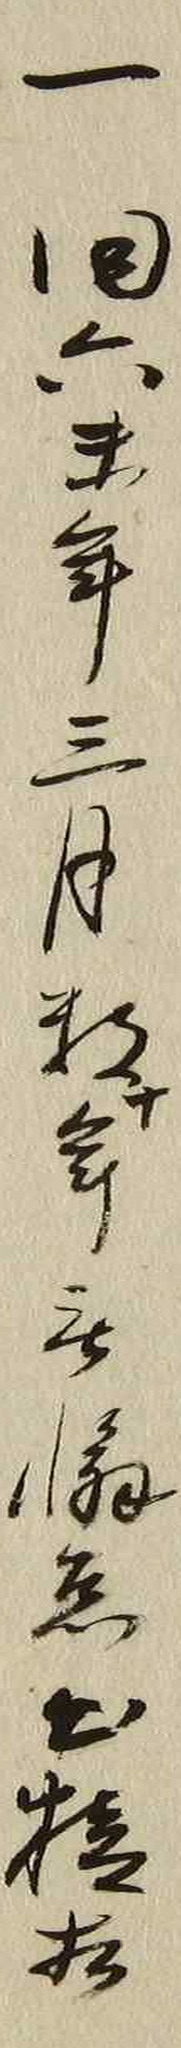一同六未年三月数十年無懈怠出精相
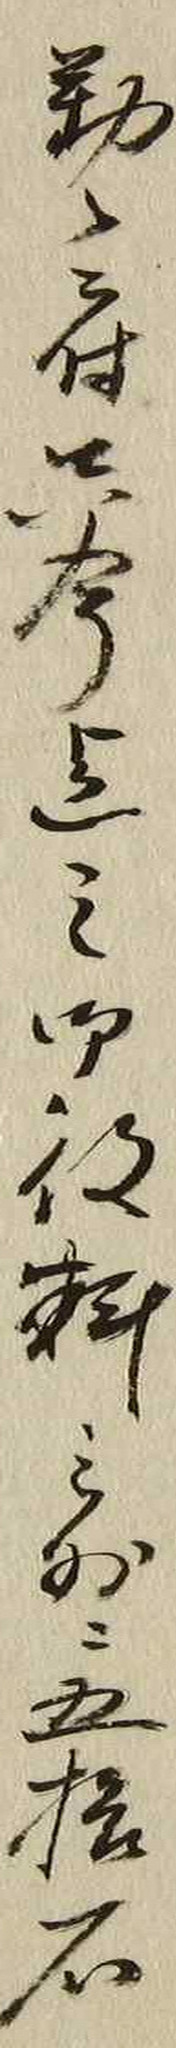勤候ニ付只今迄之御役料之外ニ五拾石
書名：諸士系譜　巻之345　も之部1
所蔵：会津若松市立会津図書館
